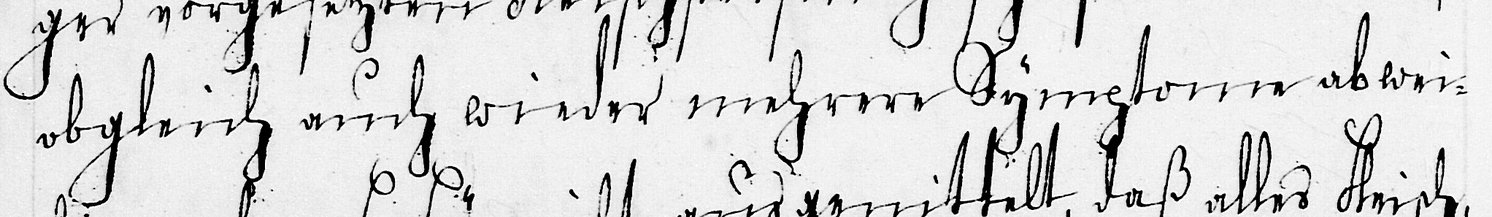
obgleich auch wieder mehrere Symptome abwei¬
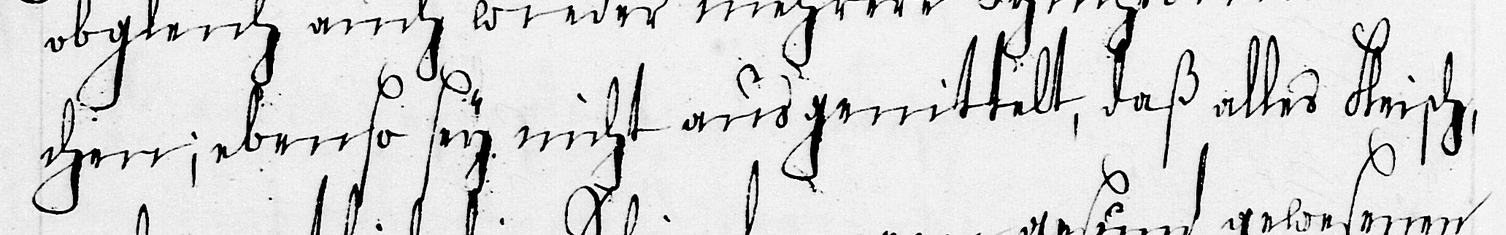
chen; ebenso sey nicht ausgemittelt, daß alles Fleisch,
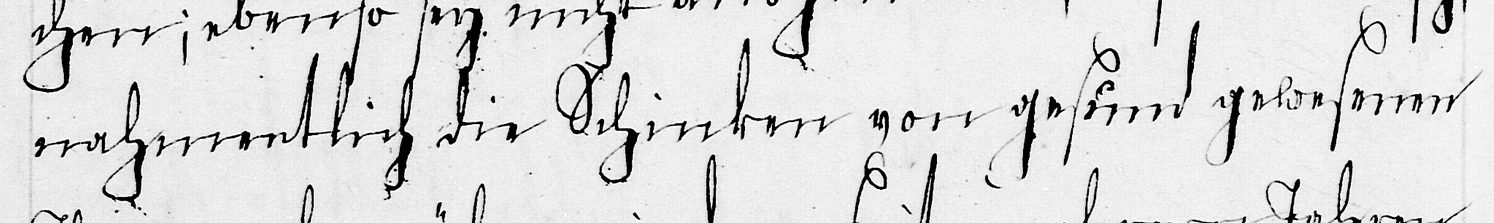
nahmentlich die Schinken von gesund gewesenen
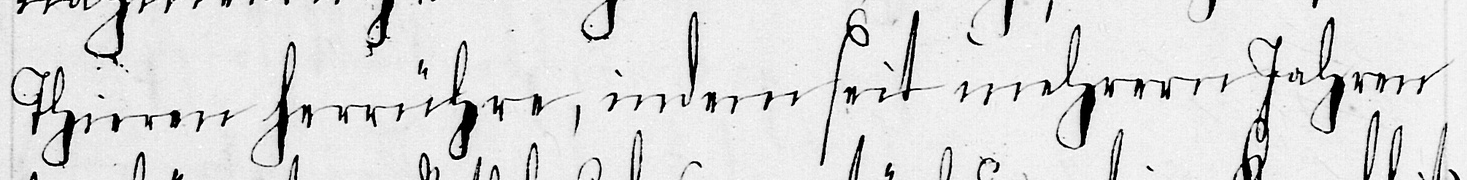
Thieren herrühre, indem seit mehrern Jahren
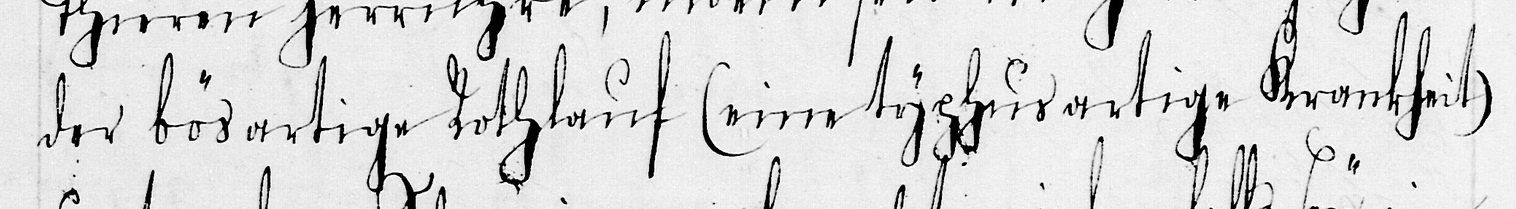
der bösartige Rothlauf (eine typhusartige Krankheit)
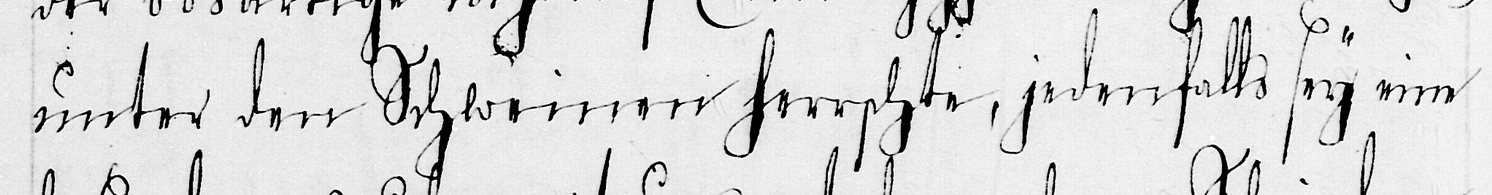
unter den Schweinen herrschte, jedenfalls sey eine
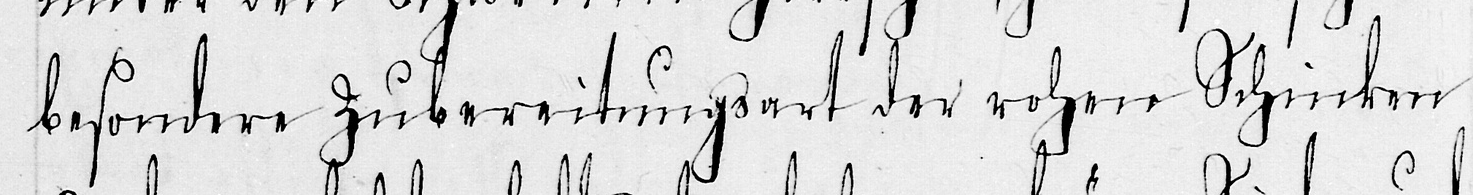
besondere Zubereitungsart der rohen Schinken
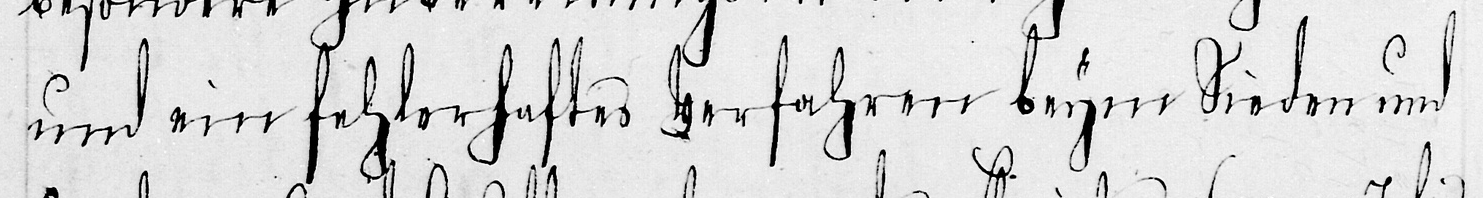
und ein fehlerhaftes Verfahren beym Sieden und
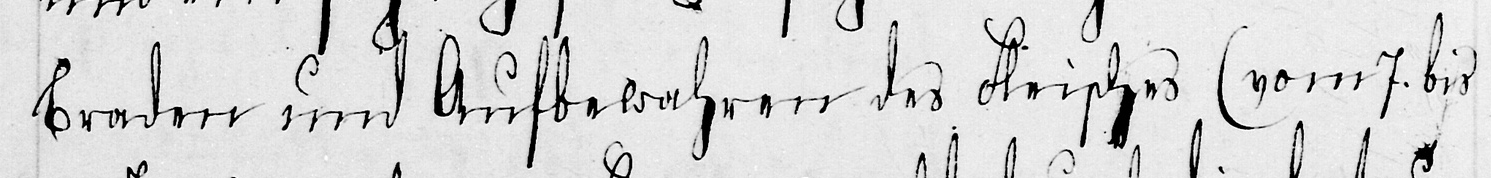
Braden und Aufbewahren des Fleisches (vom 7. bis
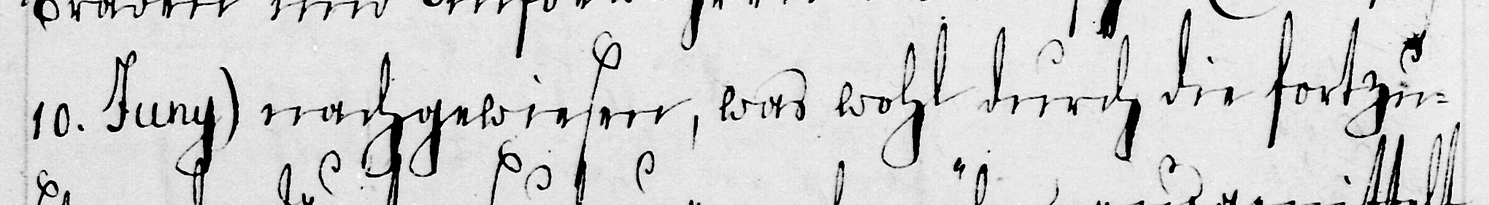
10. Juny) nachgewiesen, was wohl durch die fortzu¬
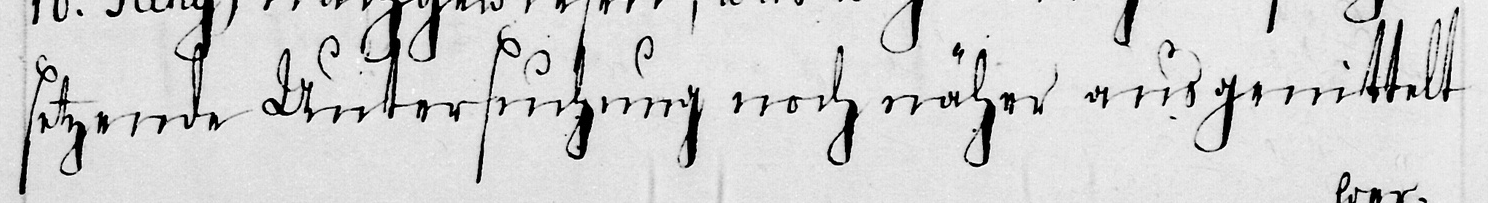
setzende Untersuchung noch näher ausgemittelt
